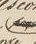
propos
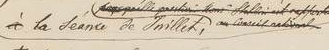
de faire prevue de satisfaire ne pas prendre une
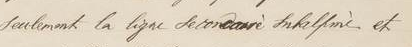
seulement la ligne secondaire subalpine et
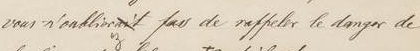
vous n'oublieraitez pas de rappeler le danger de
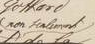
noms probablement
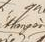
le Grand
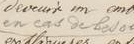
pour satisfaire à ses obligations,
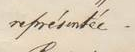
représentée.
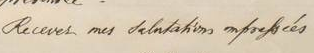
Recevez mes salutations empressées
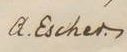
A. Escher.
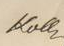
Koller
